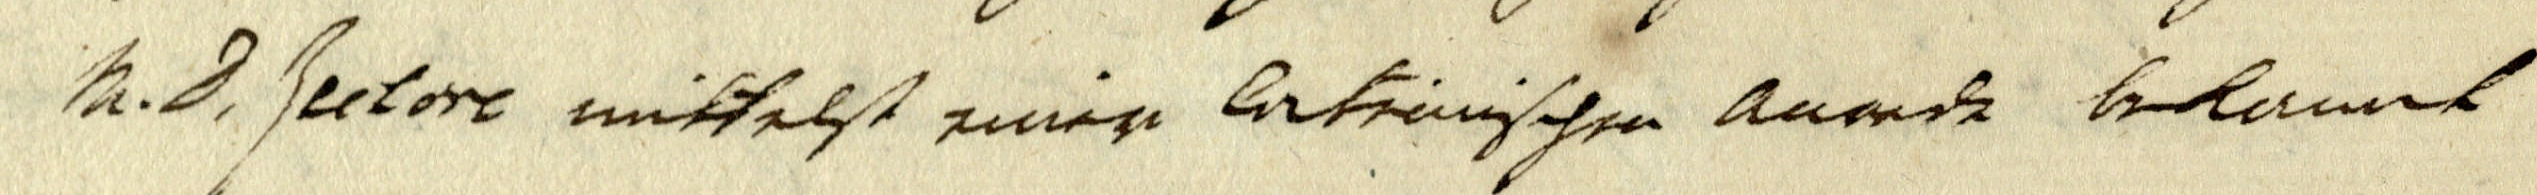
M. D. Rectore mittlest einer lateinischen Anrede bekannt
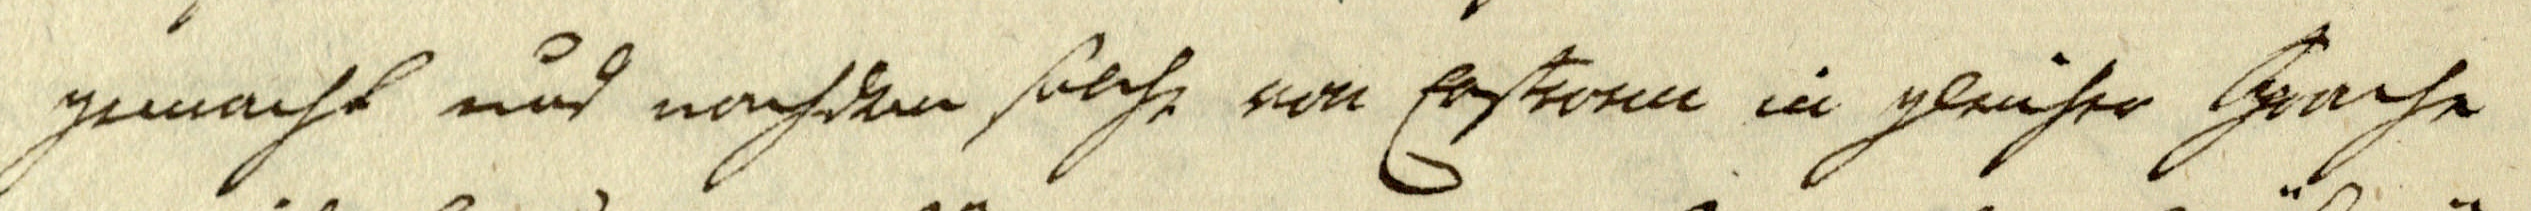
gemacht und nachdem solche von Ersterem in gleicher Sprache
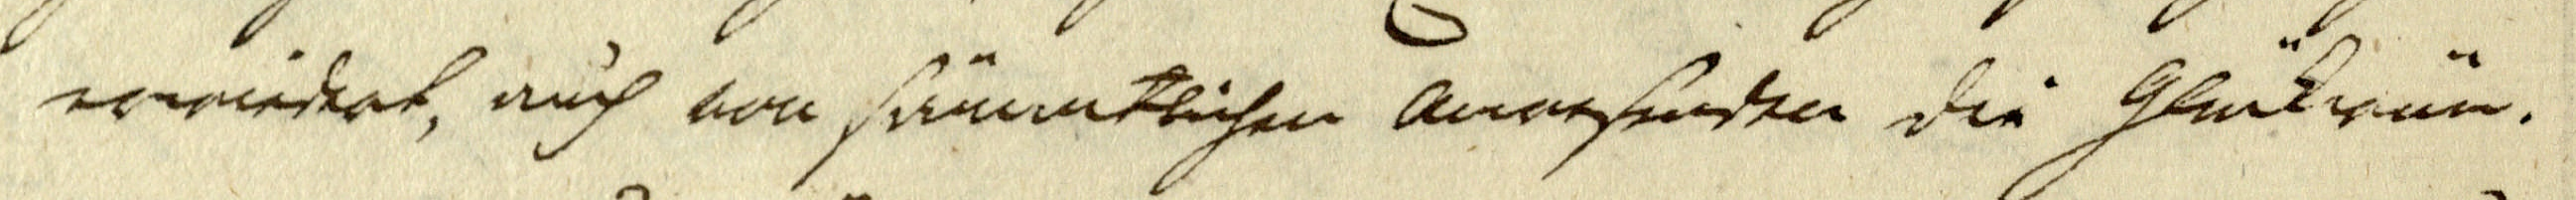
erwiedert, auch von sämmtlichen Anwesenden die Glückwün¬
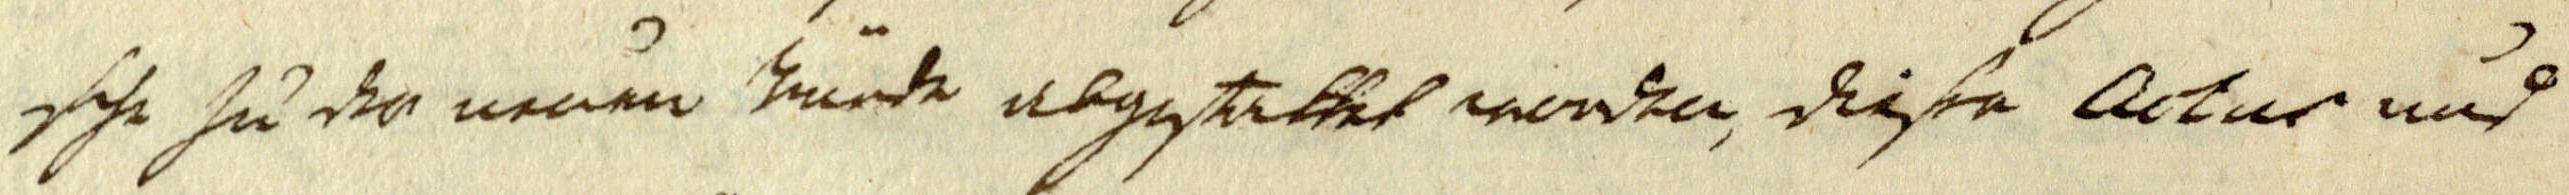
sche zu der neuen Würde abgestattet worden, dieser Actus und
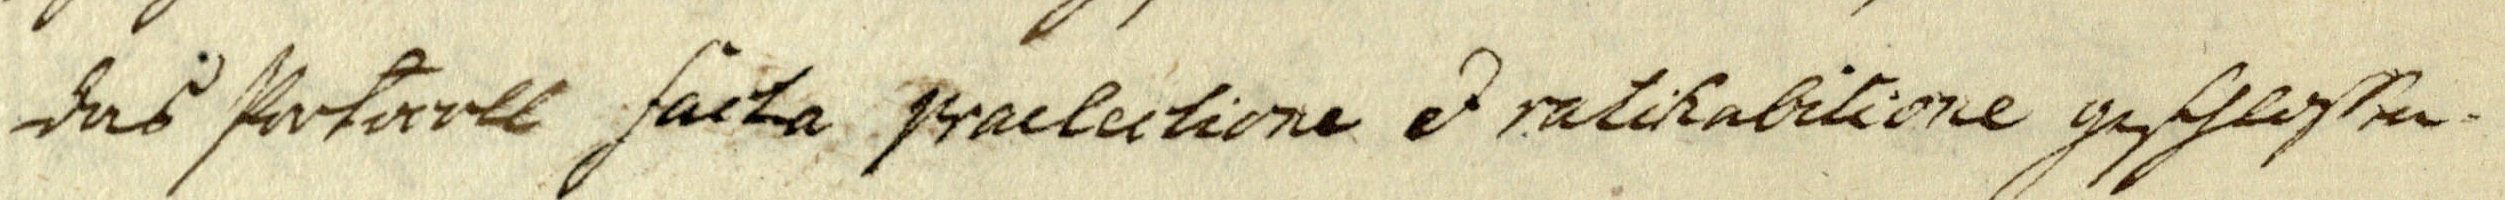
das Protocoll facta praelectione et ratihabitione geschlossen.
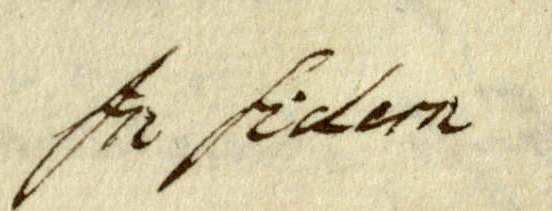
In fidem
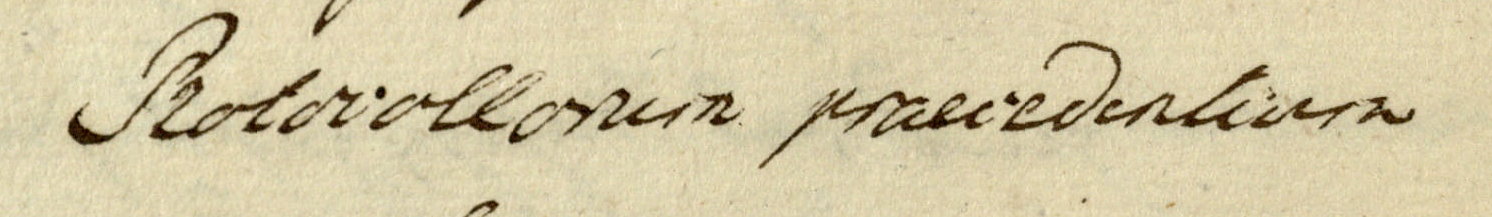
Protocollorum praecedentiren
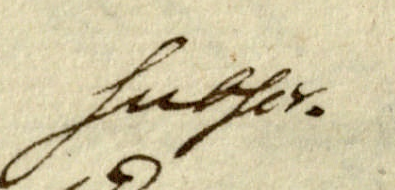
subser.
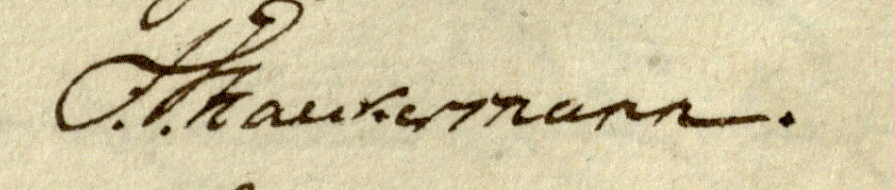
J. F. Haeckermann.
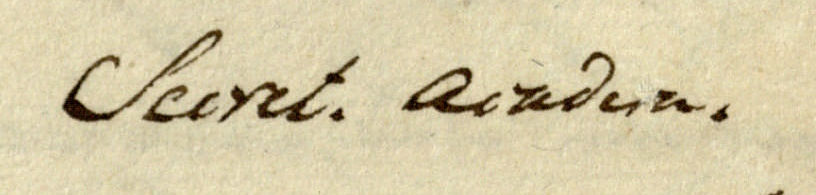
Secret. Academ.
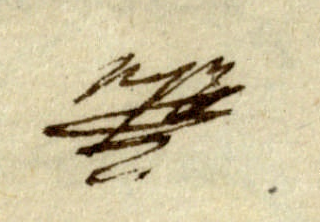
ppt.
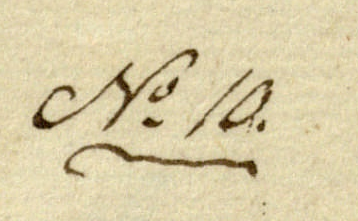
Nº 10.
